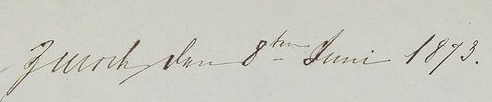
Zürich den 8ten Juni 1873.
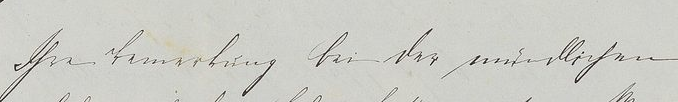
Ihre Bemerkung bei der mündlichen
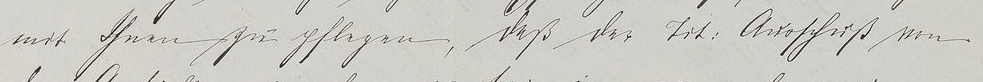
mit Ihnen zu pflegen, daß der Tit: Ausschuß von
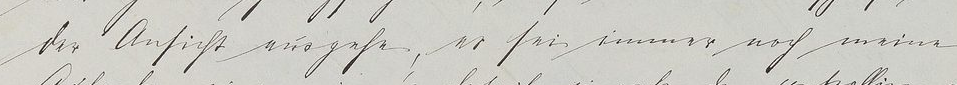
der Ansicht ausgehe, es sei immer noch meine
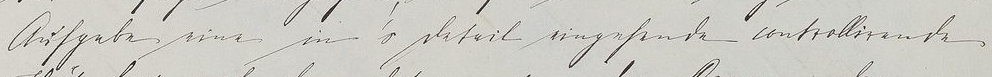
Aufgabe eine in's Detail eingehende controllirende
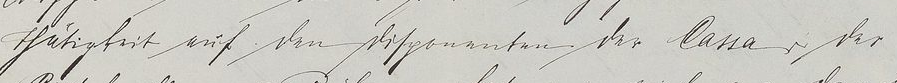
Thätigkeit auf den Disponenten der Cassa & des
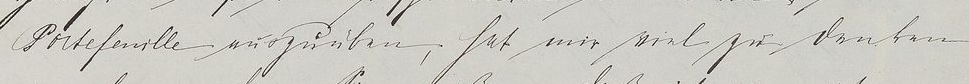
Portefeuille auszuüben, hat mir viel zu denken
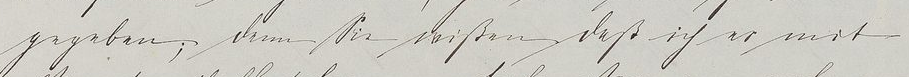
gegeben; denn Sie wißen daß ich es mit
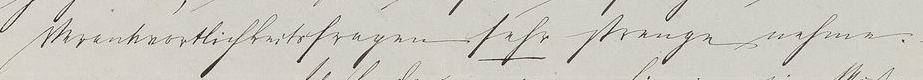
Verantwortlichkeitsfragen sehr strenge nehme. –
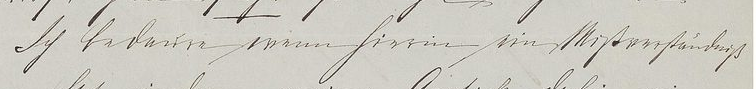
Ich bedaure wenn hierin ein Mißverständniß
